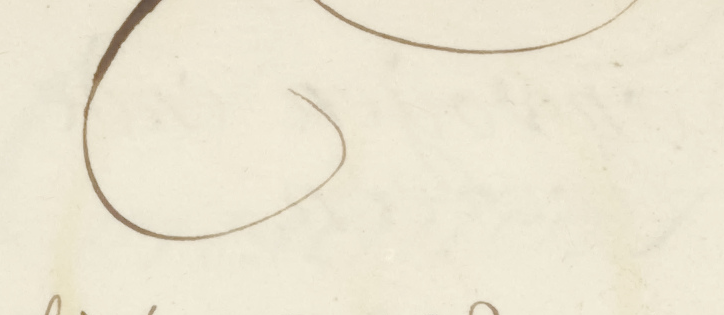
C
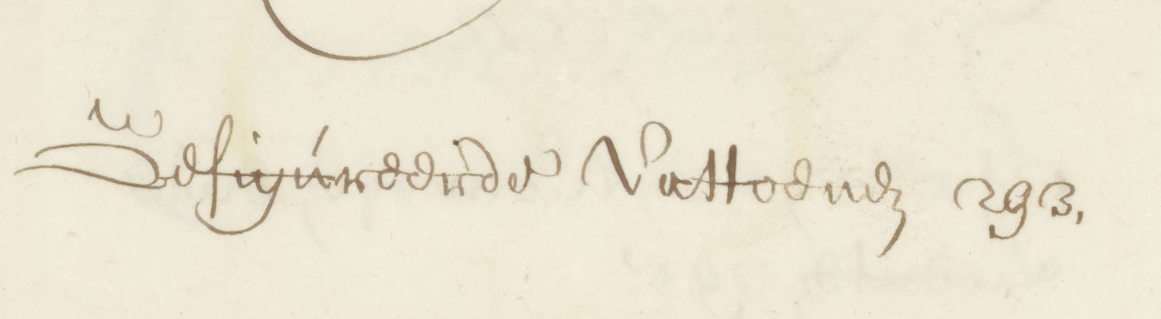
Gefigureerde Cattoenen 293.
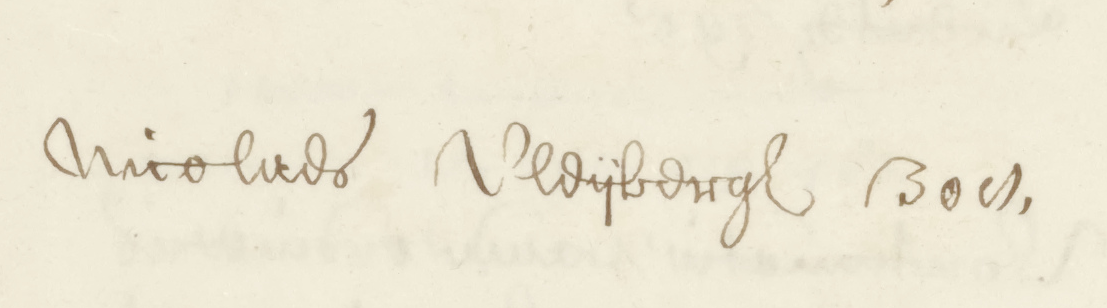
Nicolaes Cleijbergh 308.
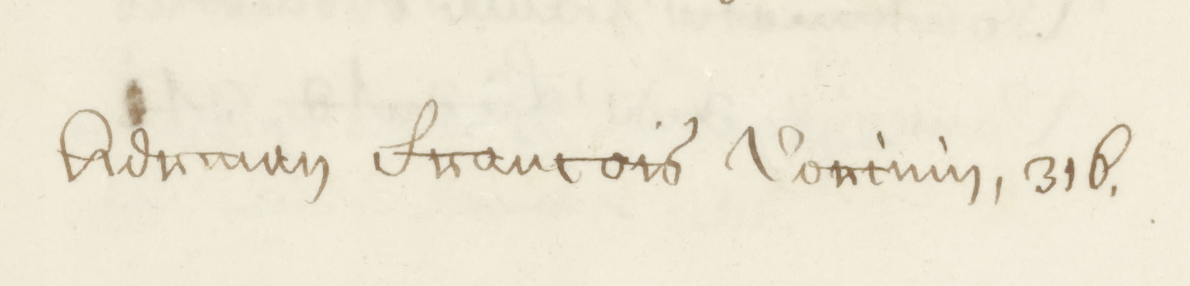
Herman Francois Corinus, 316
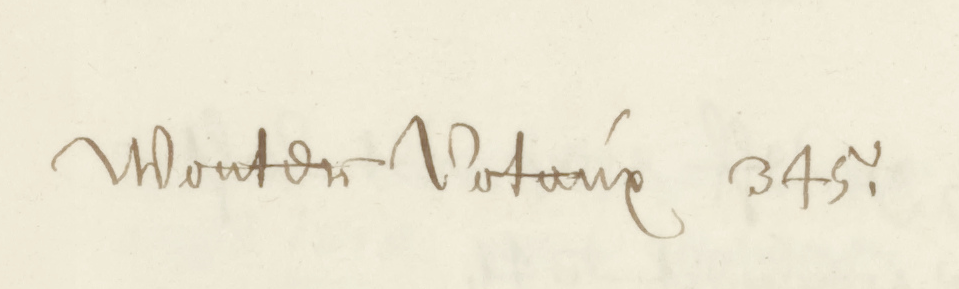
Wouter Cotaux, 345.
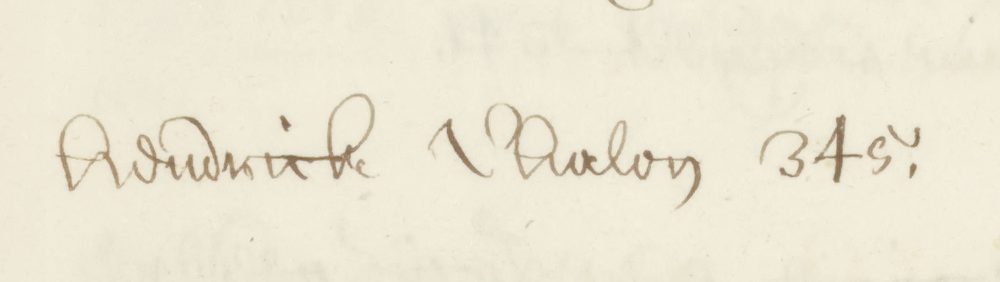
Hendrick Chalon, 345.
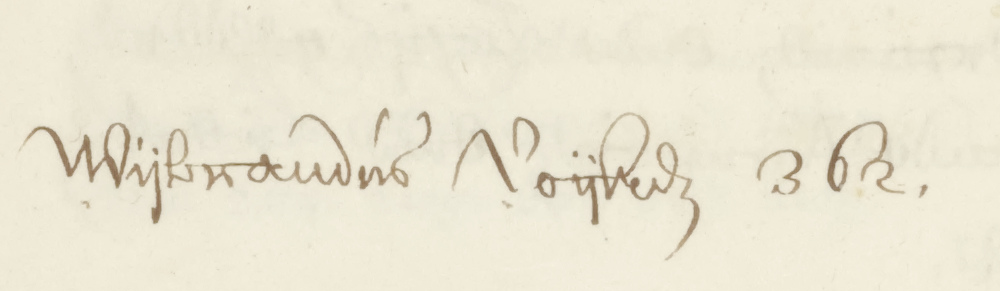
Wijbrandus Coijker 362.
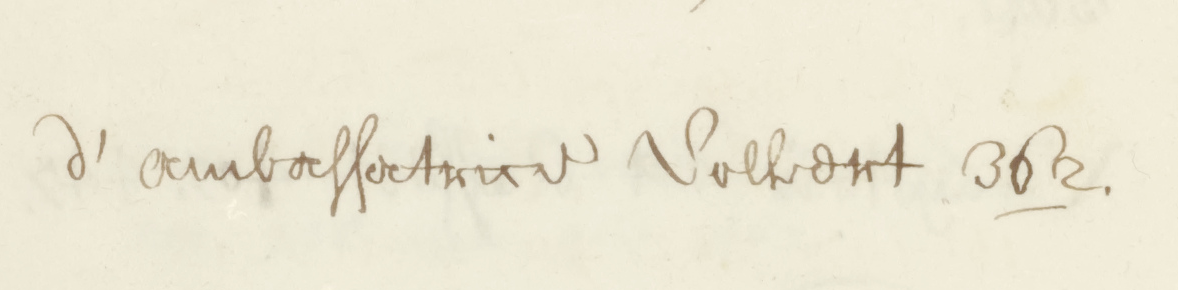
d'ambassatrice Colbert, 362.
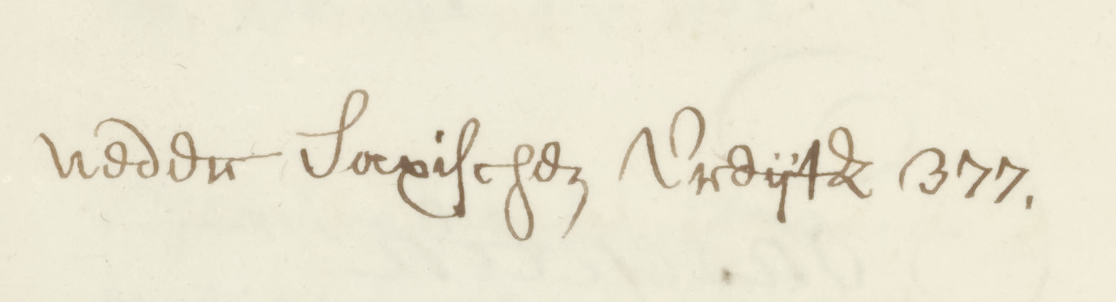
neder Saxischen Creijtz, 377.
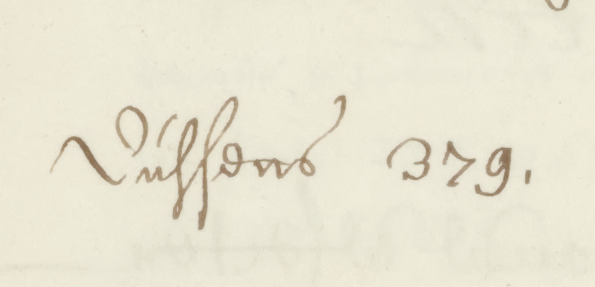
Cussens 379.
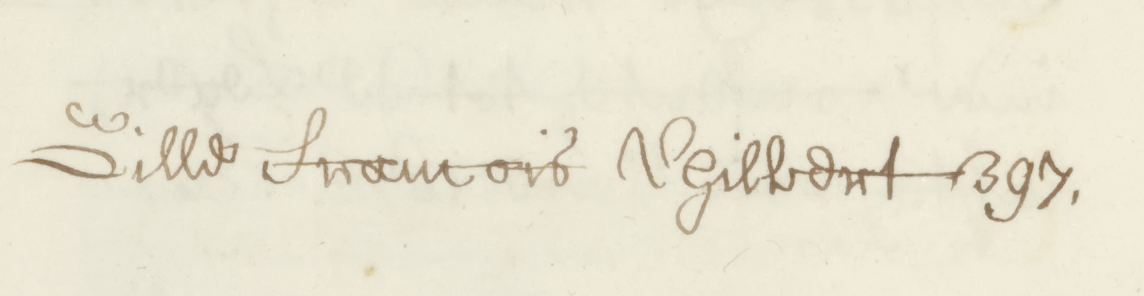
Gille Francois Chilbert 397.
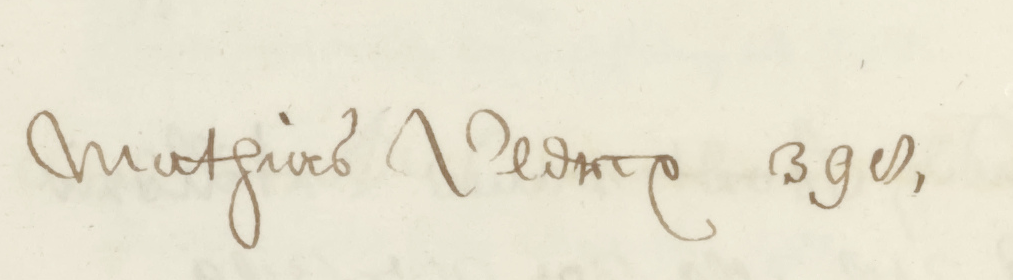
Mathias Clercx 398.
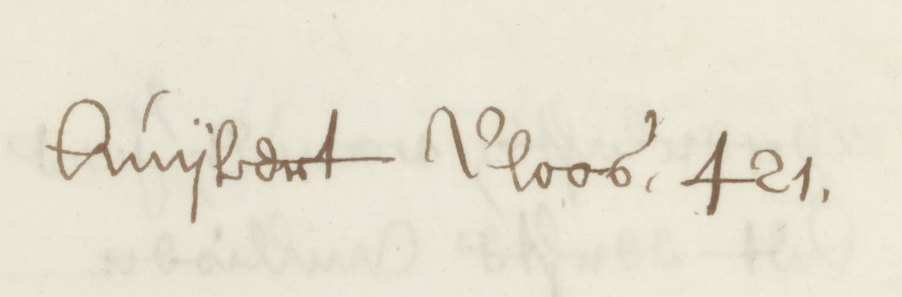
Huijbert Cloos, 421.
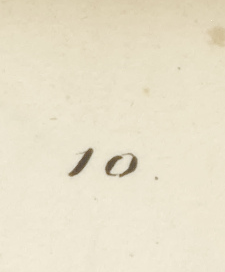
10.
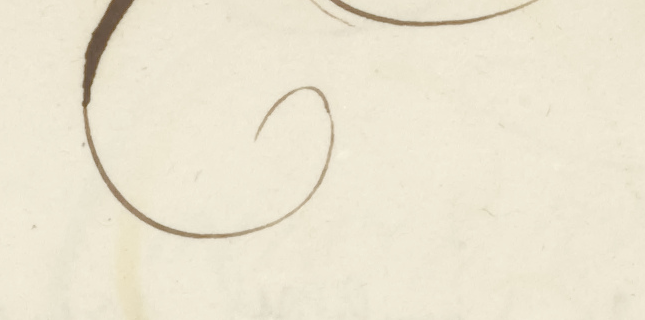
C
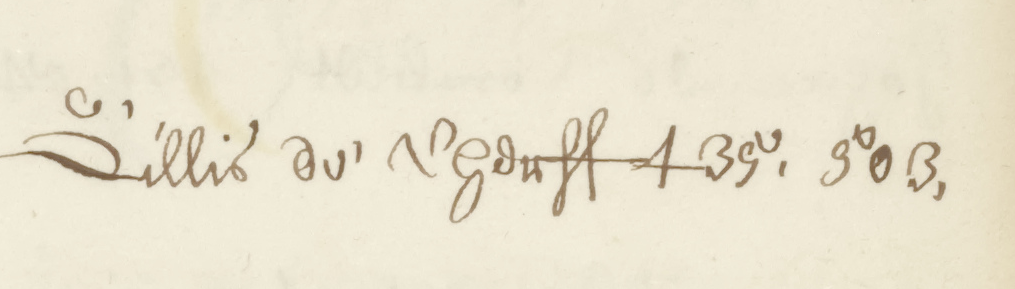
Gillis de Cherff 435, 503.
